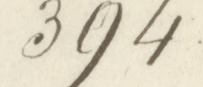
394
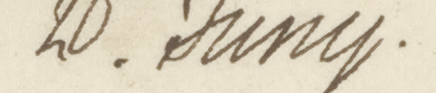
26. Junij.
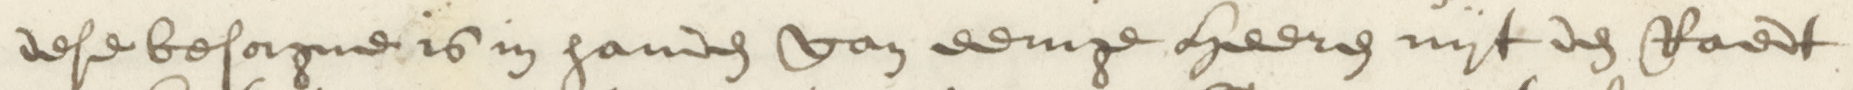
dese besoigne is in handen van eenige Heeren uijt den Raedt
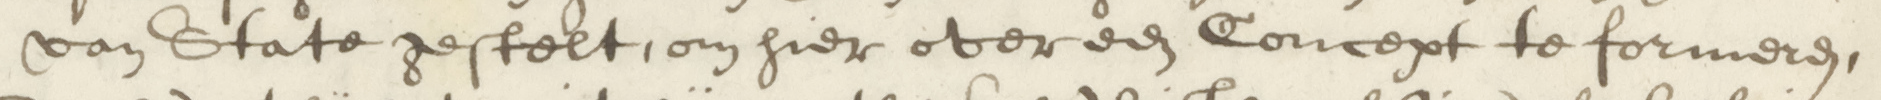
van State gestelt, om hier over een Concept te formeren,
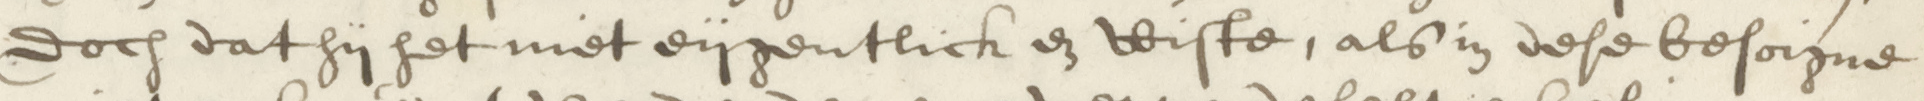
Doch dat hij het niet eijgentlick en wiste, als in dese besoigne
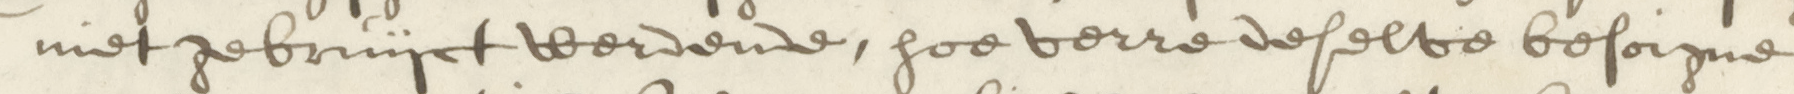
niet gebruijct werdende, hoe verre deselve besoigne
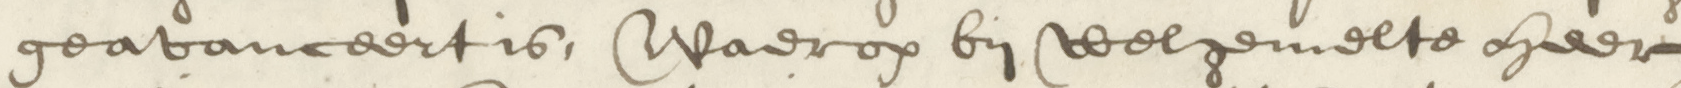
geavanceert is. Waerop bij welgemelte Heer
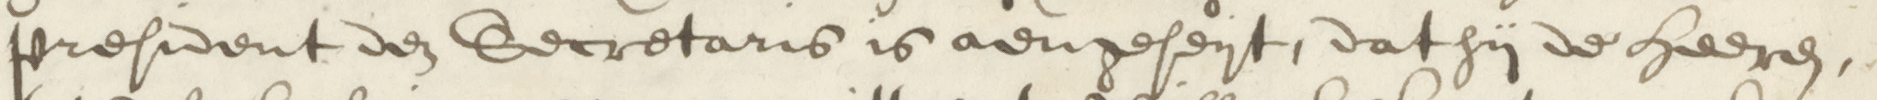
president den Secretaris is aengeseijt, dat hij de Heeren,
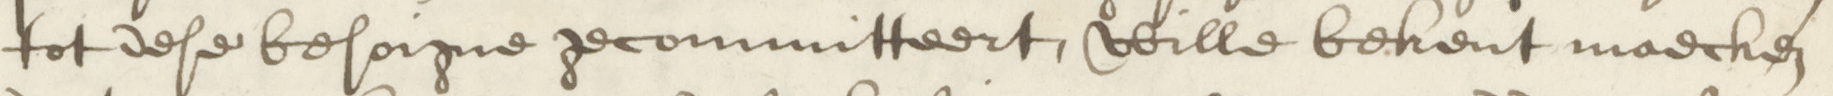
tot dese besoigne gecommitteert, wille bekent maecken
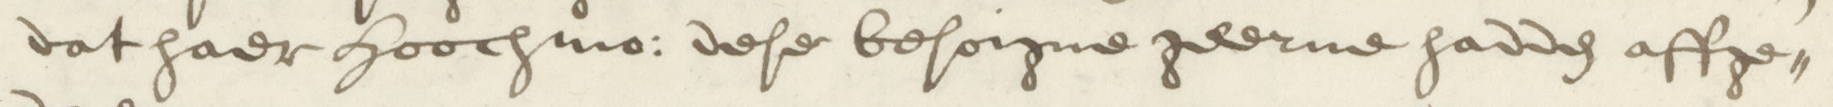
dat haer Hooch mo: dese besoigne geerne hadden affge„
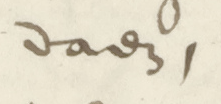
daen.
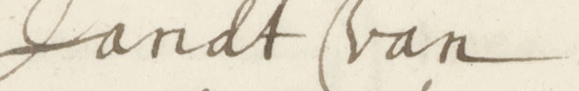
Landt van
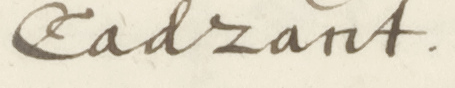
Cadzant.
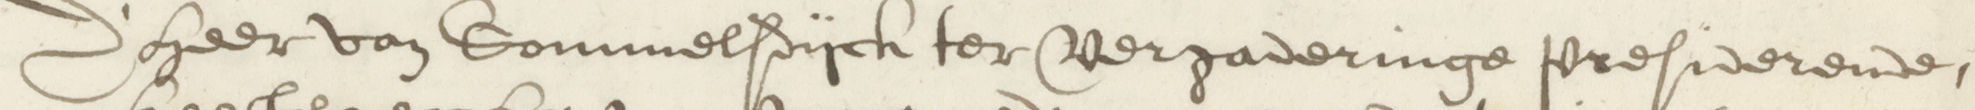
D'Heer van Sommelsdijck ter Vergaderinge presiderende,
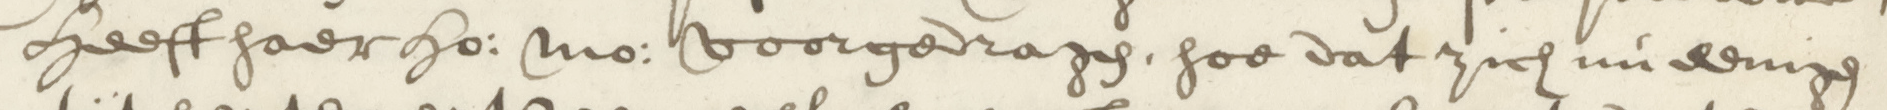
Heeft haer Ho:Mo: voorgedragen, hoe dat zich nu eenigen
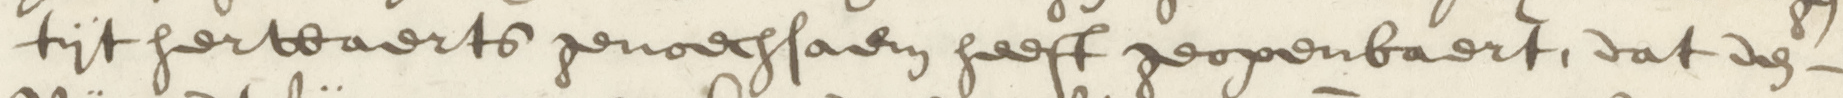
tijt herwaerts genoechsaem heeft geopenbaert, dat den-
